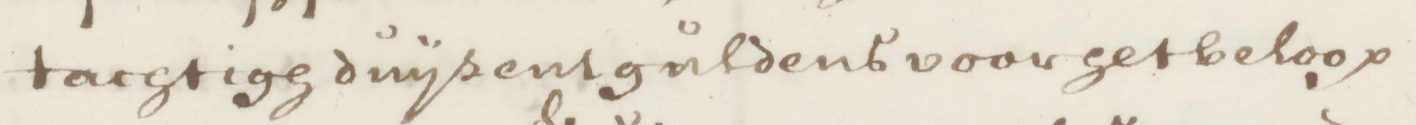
tachtighduijsent guldens voor het beloop
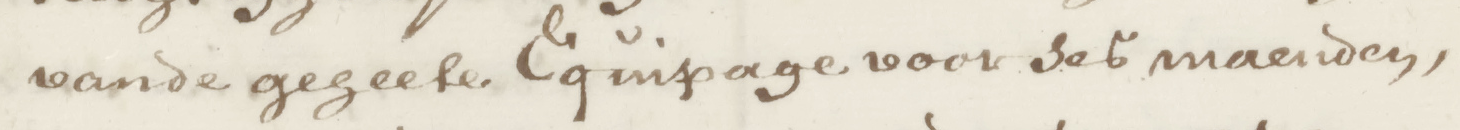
vande geheele Equipage voor ses maenden,
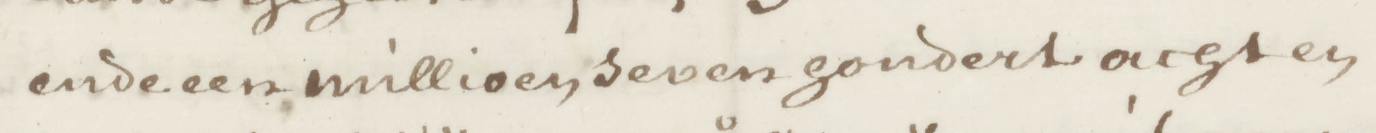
ende een millioen seven hondert acht en
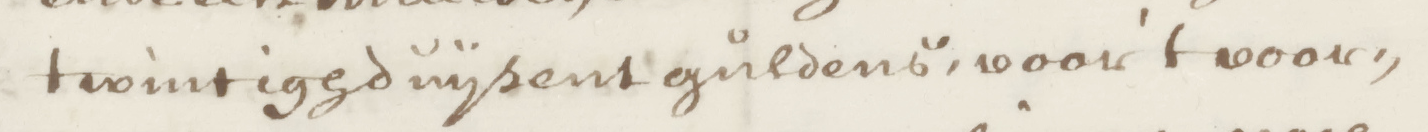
twintighduijsent guldens, voor ‛t voor„
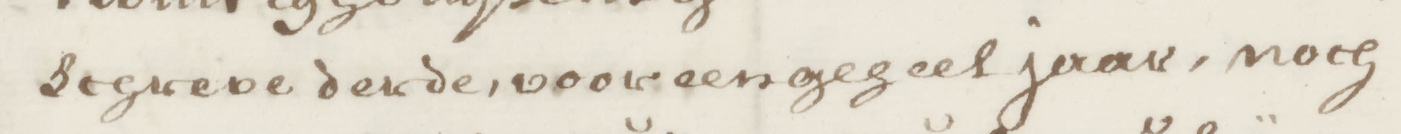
schreve derde, voor een geheel jaar, noch
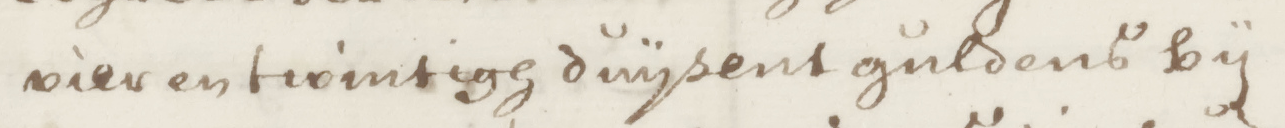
vier en twintigh duijsent guldens bij
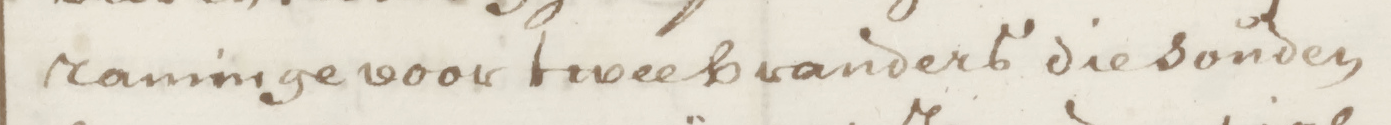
raminge voor twee branders die souden
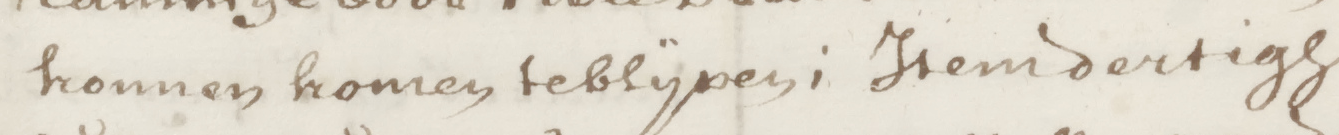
konnen komen te blijven; Item dertigh
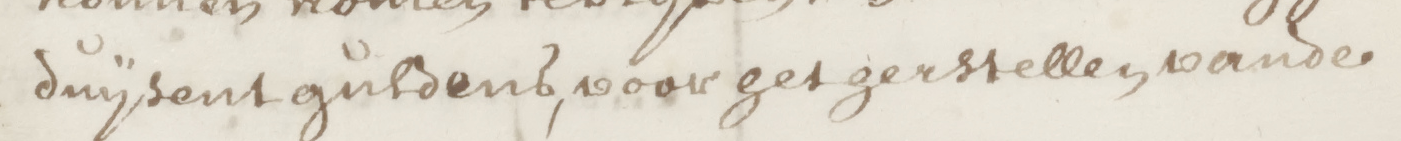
duijsent guldens, voor het herstellen vande
